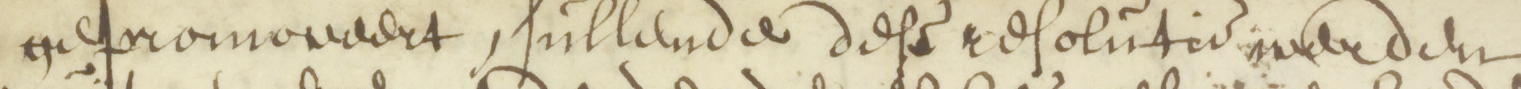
gepromoveert, sullende dese resolutie werden
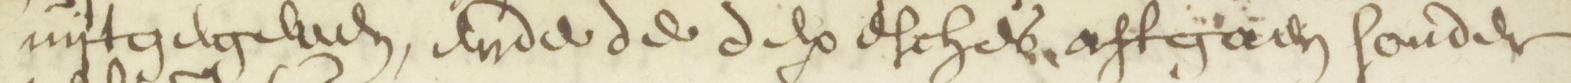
uijtgegeven, ende de depesches affgaen sonder
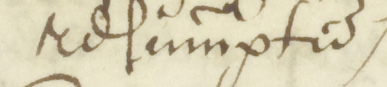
resumptie.
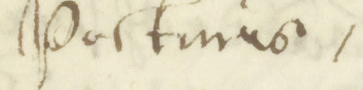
Postmrs.
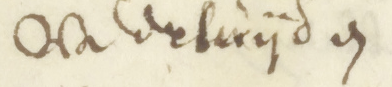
Vaerluijden
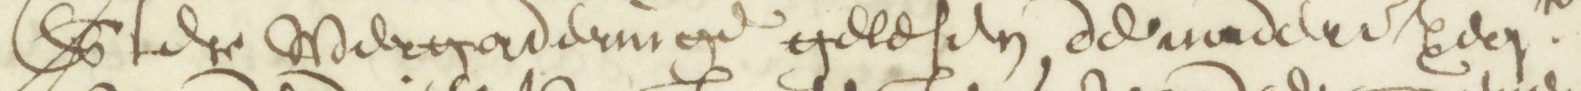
Is ter Vergaderinge gelesen de nadere Reqte.
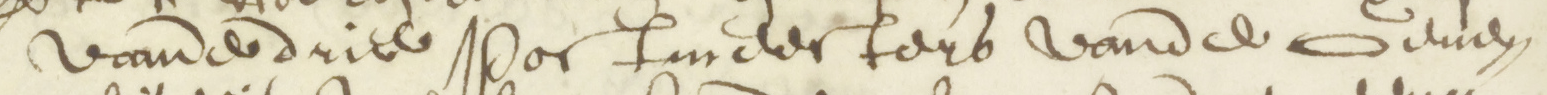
vande drie Postmeesters vande Gene„
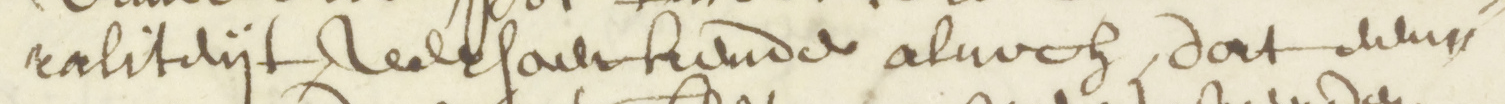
raliteijt, versoeckende alnoch, dat een„
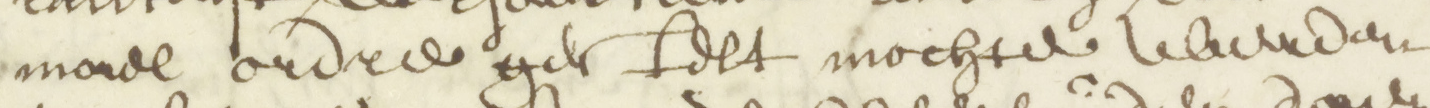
mael ordre gestelt mochte werden
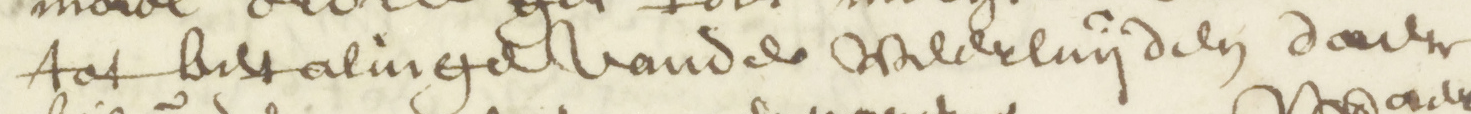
tot betalinge vande Veerluijden daer
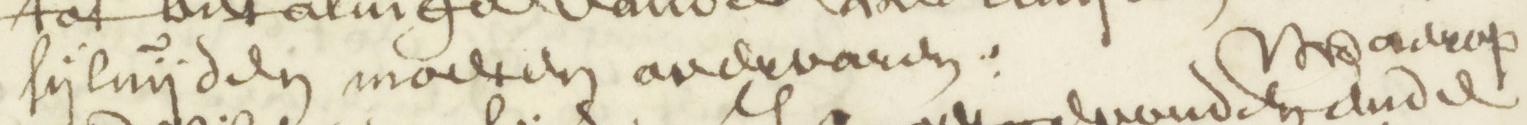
sijluijden moeten overvaren: Waerop
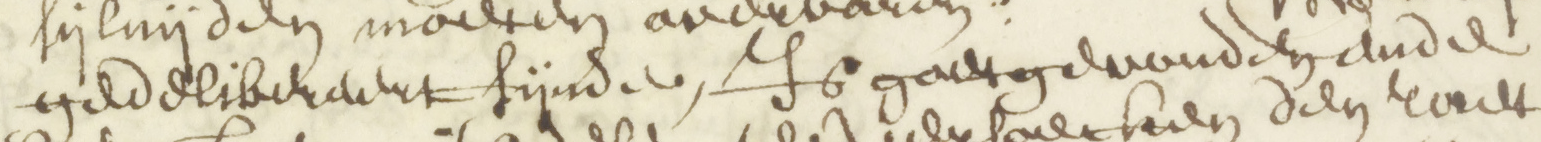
gedelibereert sijnde, Is goetgevonden ende
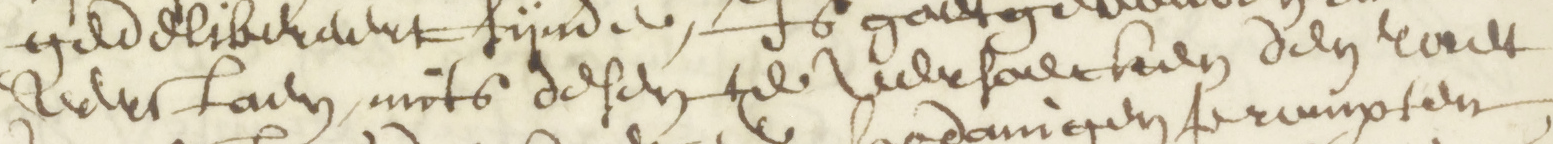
verstaen, mits desen te versoecken den raet
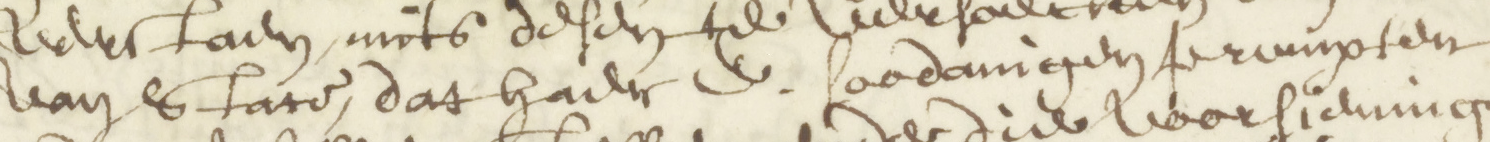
van State, dat haer E. soodanigen prompten
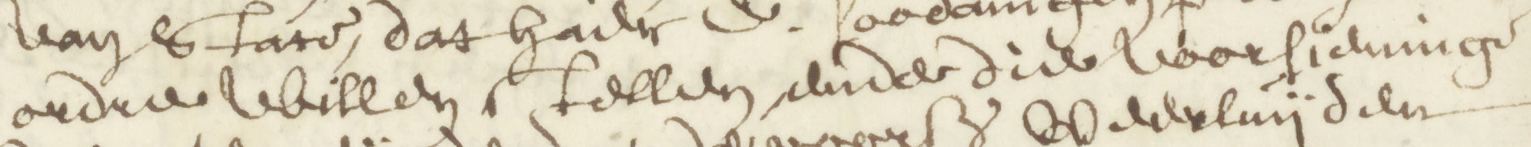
ordre willen stellen, ende die voorsieninge
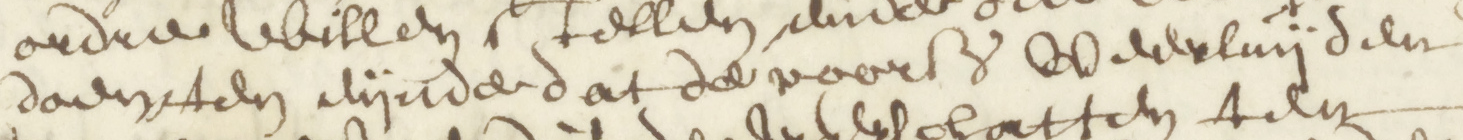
doen, ten eijnde dat de voorsz Veerluijden
